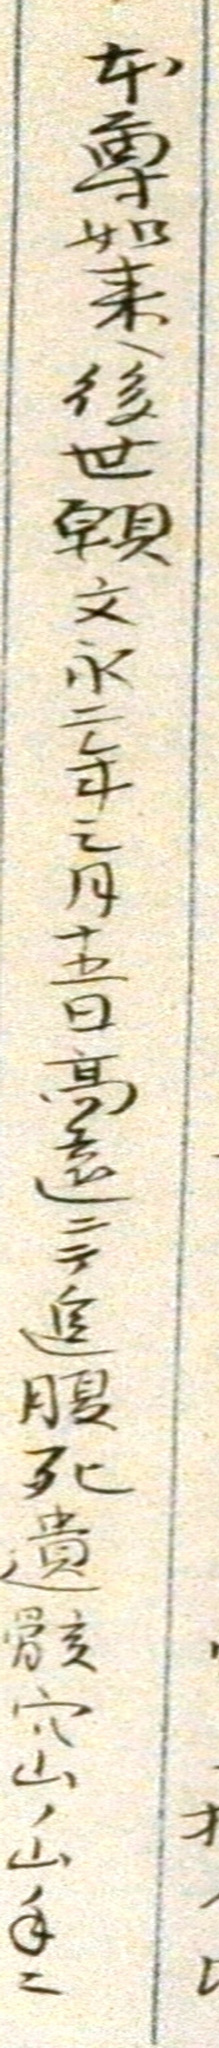本尊如来へ後世願文永二年三月十五日高遠ニテ追腹死遺骸穴山ノ山手ニ
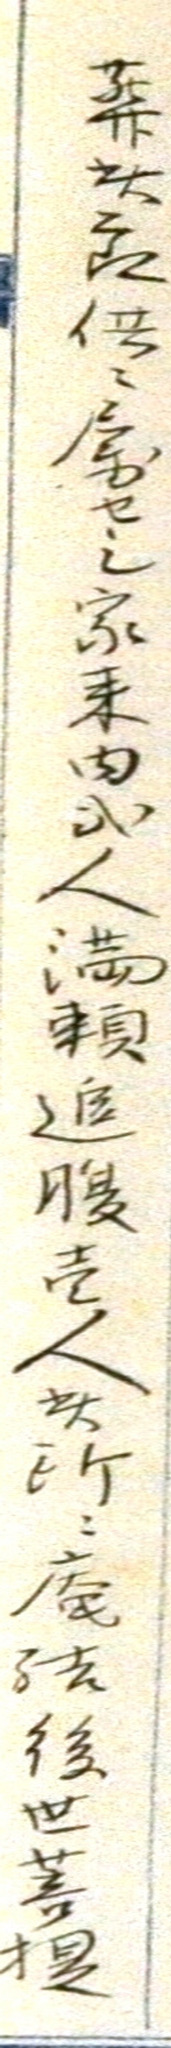葬此節供ニ属セシ家来内弐人満頼追腹壱人此所ニ庵結後世菩提

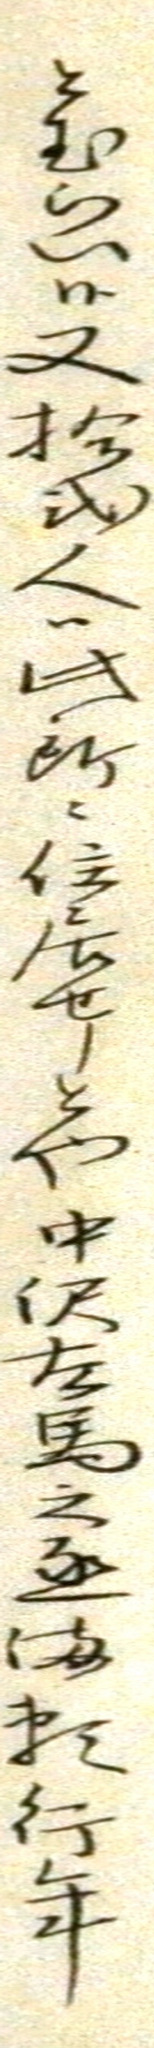とむらい候又拾弐人ハ此所ニ住居せしとや中沢左馬之丞満頼行年
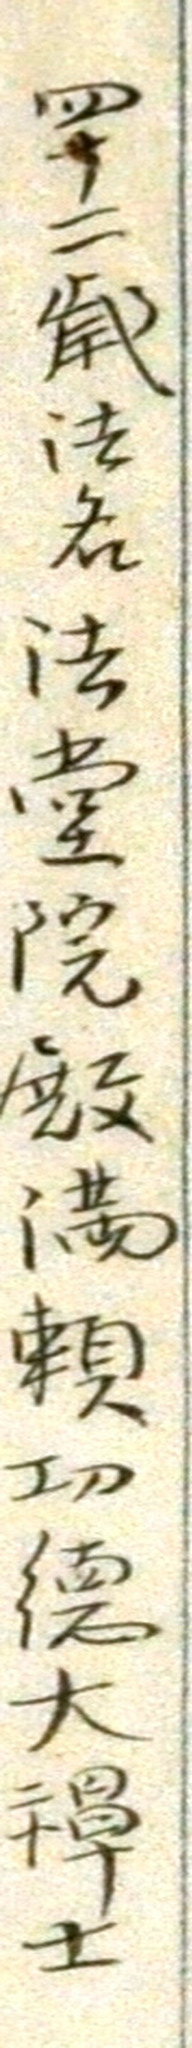四十二歳法名法堂院殿満頼功徳大禅士
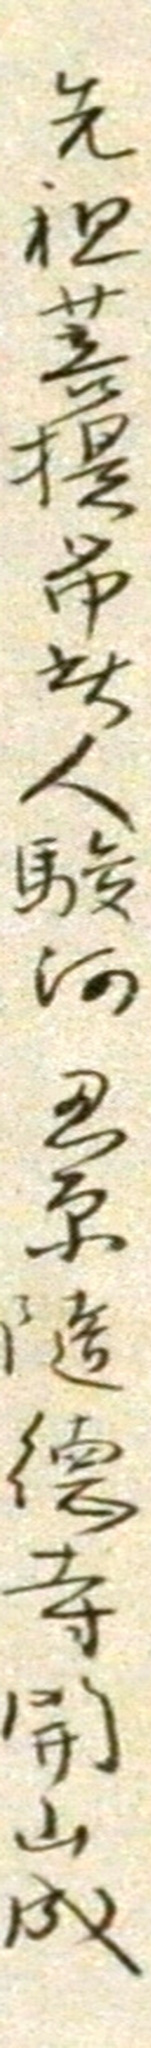應住先祖菩提◻︎此人駿河忍原随徳寺開山成
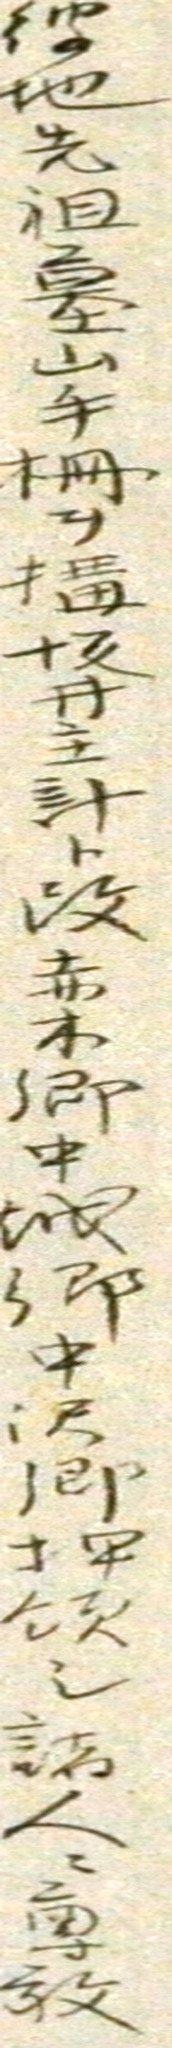彼地先祖墓山手柵ヲ搆坂井主計ト改赤木郷中城郷中沢郷押領シ諸人ニ尊敬
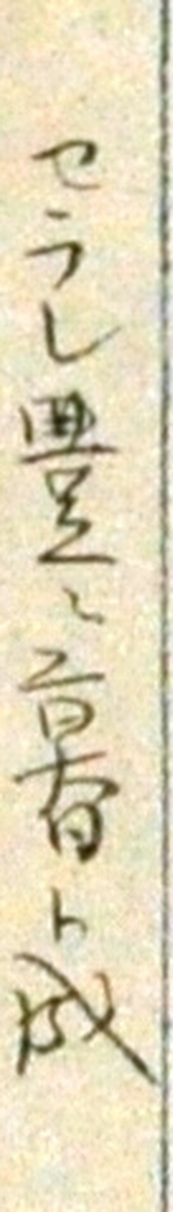セラレ豊ニ暮ト成
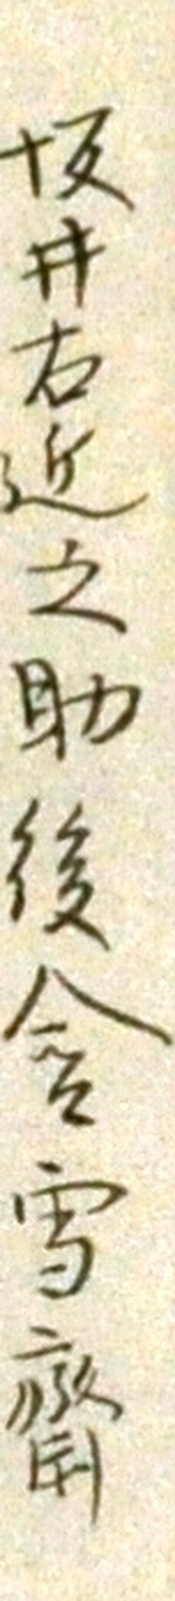信実坂井右近之助後雪齋
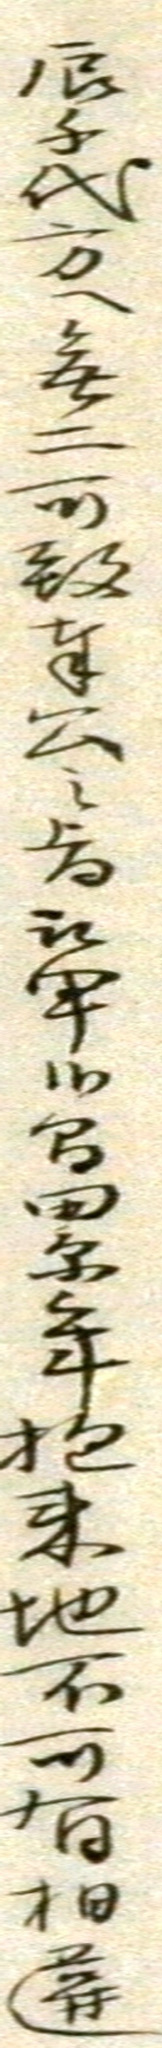辰千代方へ無二可致奉公之旨被甲候間累年抱来地不可有相違
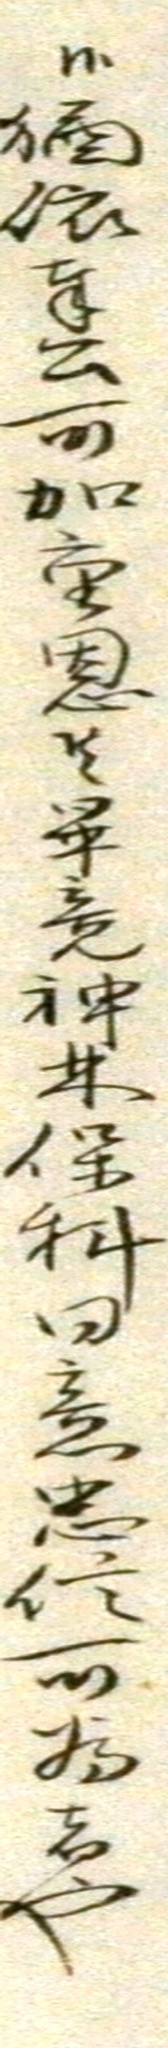候猶依奉公可加重恩共畢竟神林保科日意忠信可為旨也
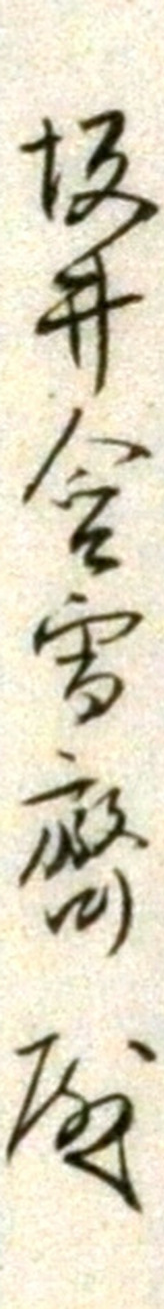坂井会雪齋殿
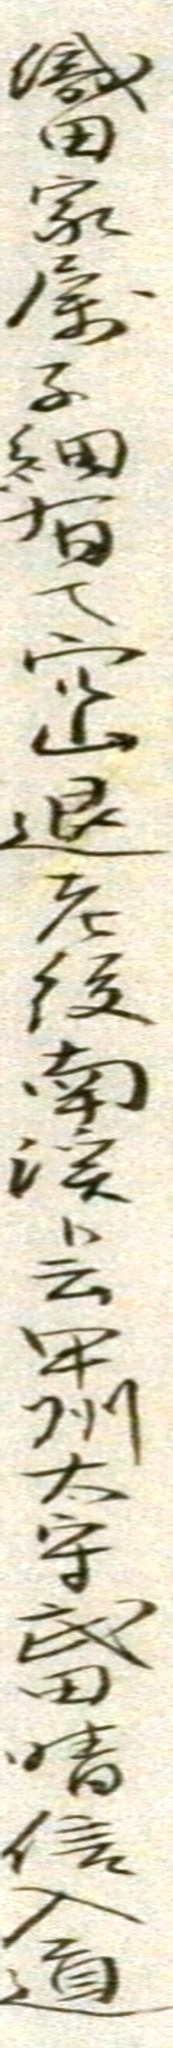織田家属子細有之穴山退老後南渓ト云う甲州太守氏田晴信入道
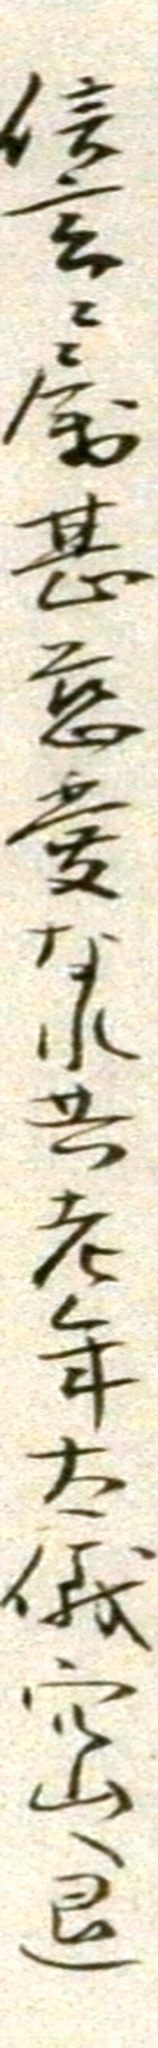信玄ニ属甚慈◻︎なれ共老年太儀穴山へ退
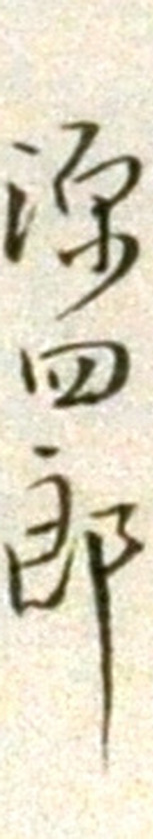源四郎
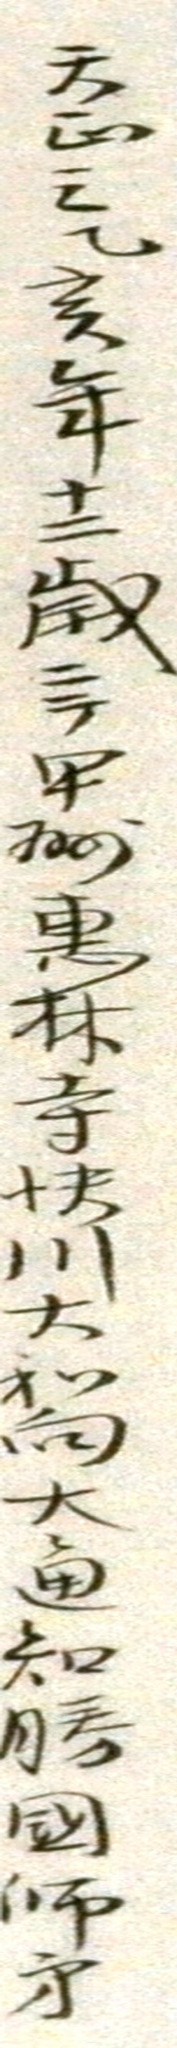天正元乙亥年十二歳ニテ甲州恵林寺快川大和向大通知勝国師弟
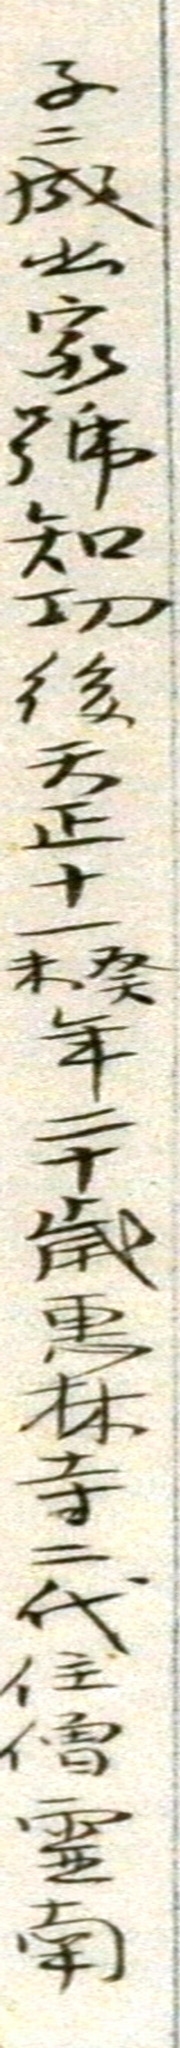子ニ成出家号知功後天正十一癸未年二十歳恵林寺二代住僧霊南
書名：三好氏先代以来勤仕録、池田丈介一家勤仕録
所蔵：伊那市立高遠町図書館・合同会社AMANE
